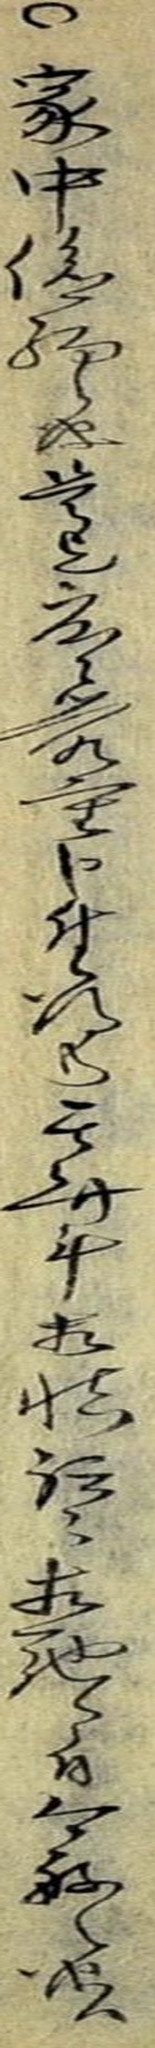○家中倹約之儀是迄度々厳重申付候得共其刻斗相慎跡々相弛候に付今般之儀は
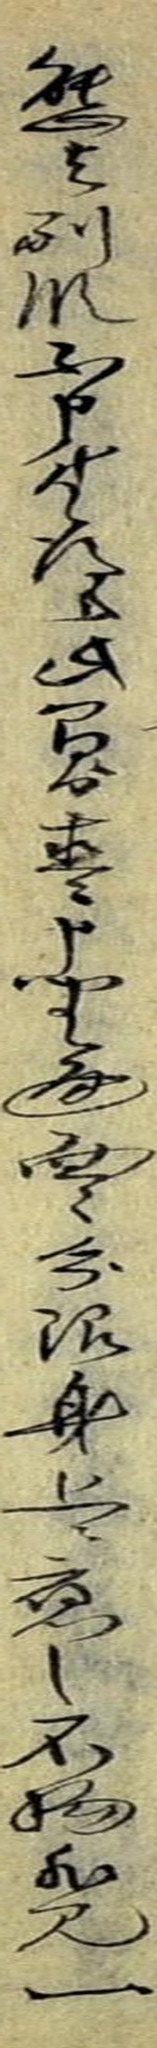態と別段不申付候得共此間ゟ直々申聞候通面々分限身上に応し不拘外見一
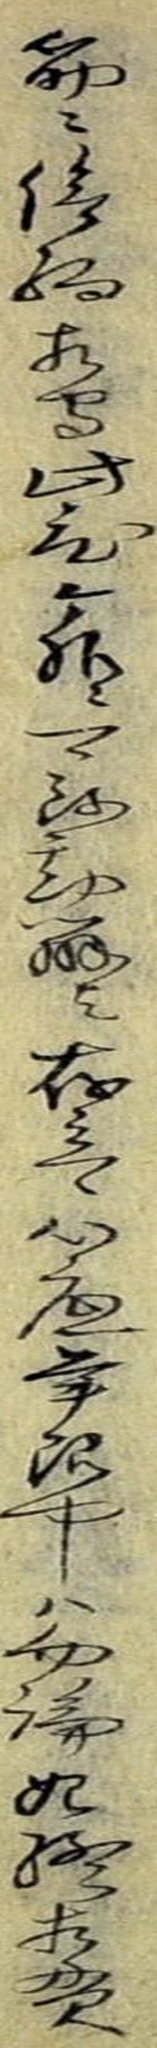筋に倹約相守此度ヶ様に可致勘弁と存立候心底年限中は勿論如何相貫
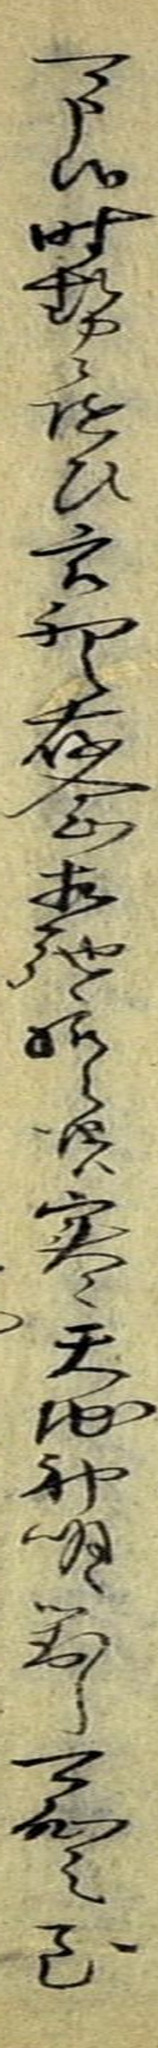可申候時勢に随ひ最初之存念相弛候始之儀は実に天地神明之以前之可知と而己
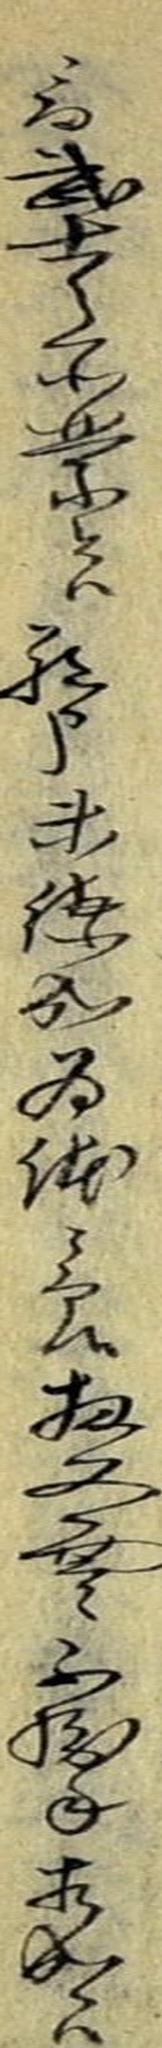に而武士之所業とは難申未僚成為体に而は扨又面々不勝手相成候は
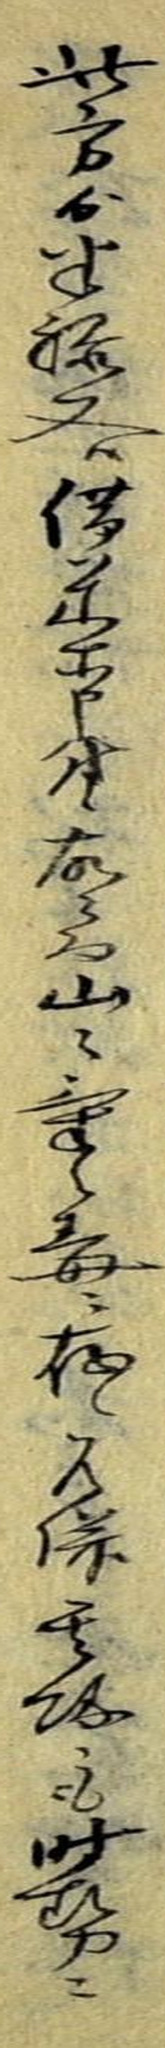此方ゟ半禄又は借米等申付候故に而山々気之毒に存候乍併其餘にも時勢に

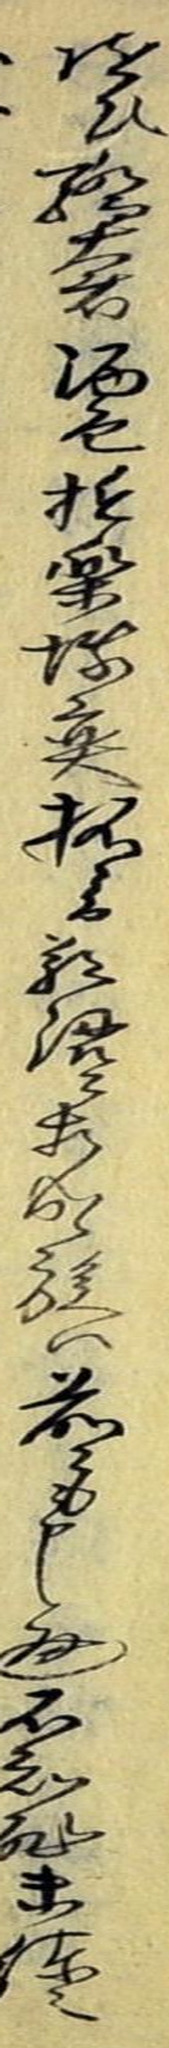随ひ驕奢酒色遊楽博奕抔に而難渋に相成候族は前々も申候通不知恥未練之
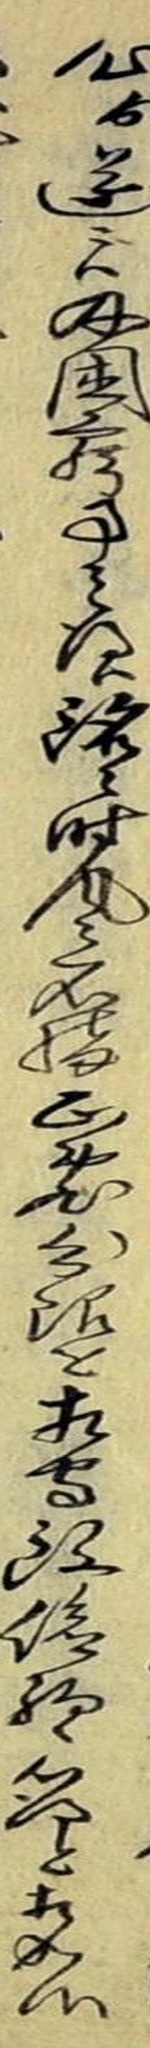心ゟ遂には及困窮事に候得は銘々時風に不構正敷分限を相守致倹約候心得と相成候
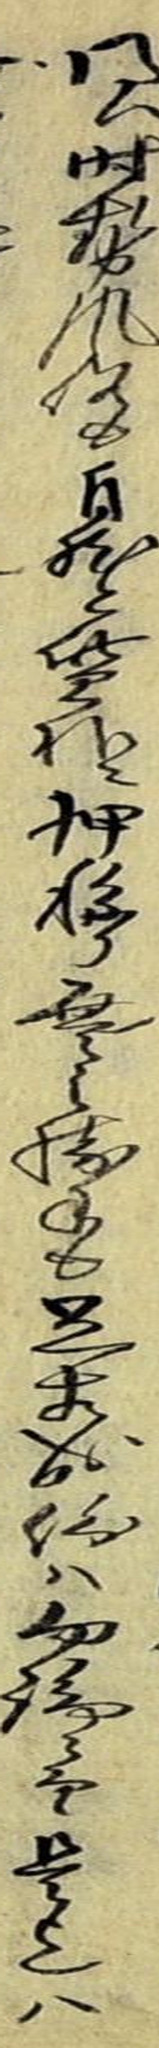得は時勢風俗も自然と質朴に押移り面々之勝手も宜相成儀は勿論に而候是迄は
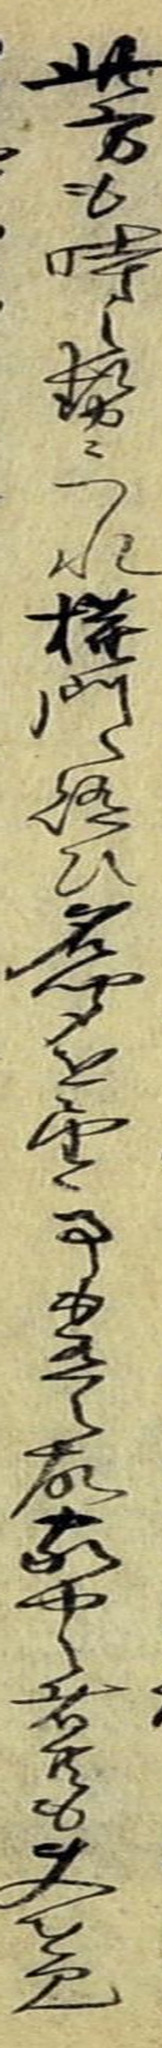此方も時之勢につれ権門へ随ひ名声を望み候事も有之候故家中之者共も夫を見
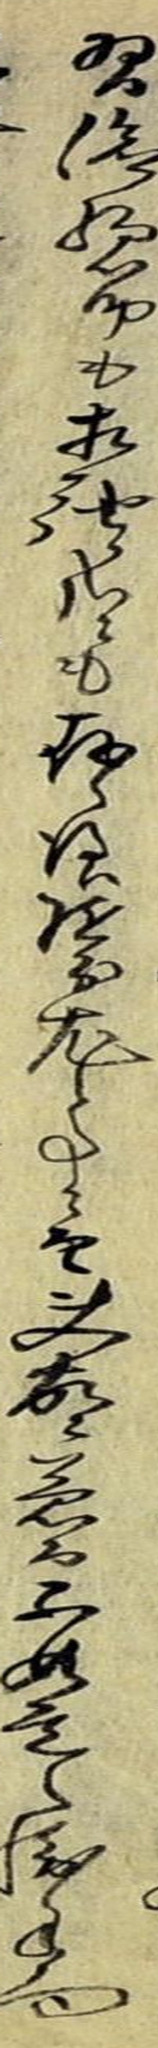習倹約筋も相弛候哉にも存候得は随分尤之事に而候夫故に兼而不如意之勝手向
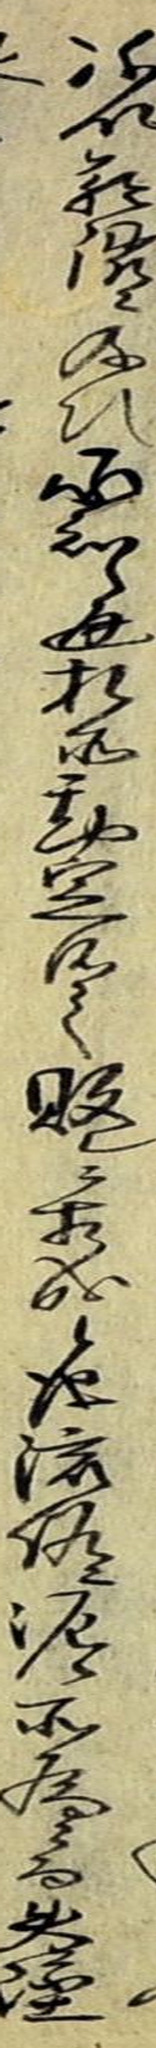弥以難渋に及ひ承知之通札所勘定所之敗レに相成候儀流俗に泥候所為に而失墜
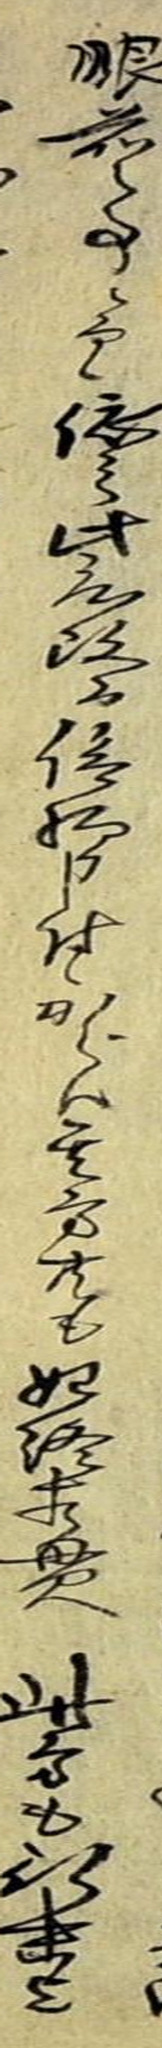眼前之事に而候依之此度改而倹約申付候からは其方共も始終相貫此方も行末迄
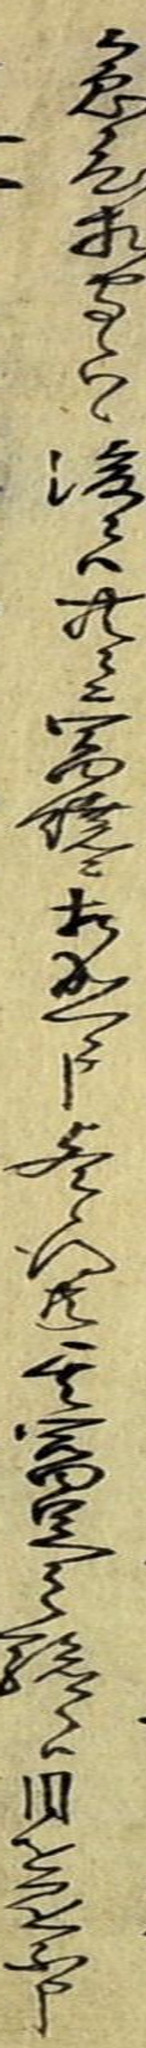急度相守候はヽ後々は共々に冨饒に相成可申歟に候得共其冨足之驕には目を懸不申
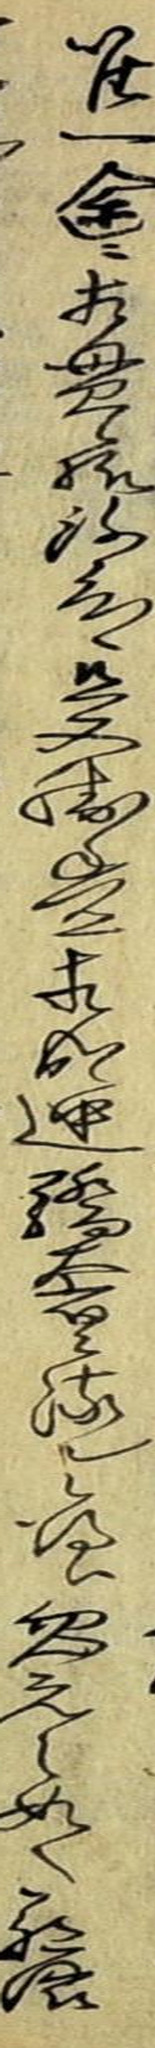唯一途に相貫候様致度候且又勝手宜相成候迚驕奢に流レ候得は忽元之如之難渋
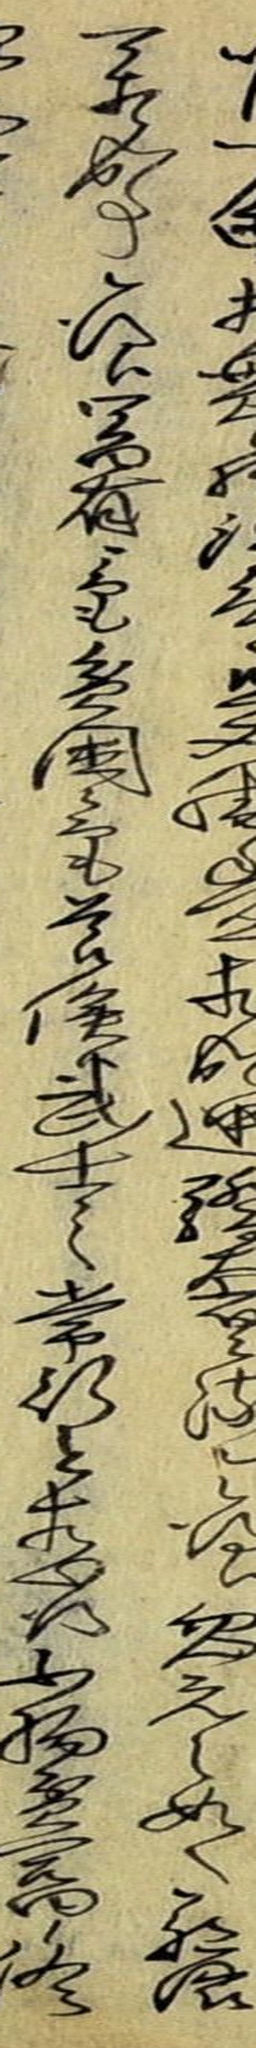可相成事候得は富有二而も貧困に而も節倹は武士之常行と相心得不拘貧富終
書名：命令之部 六
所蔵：福井県文書館 Fukui Prefectural Archives
